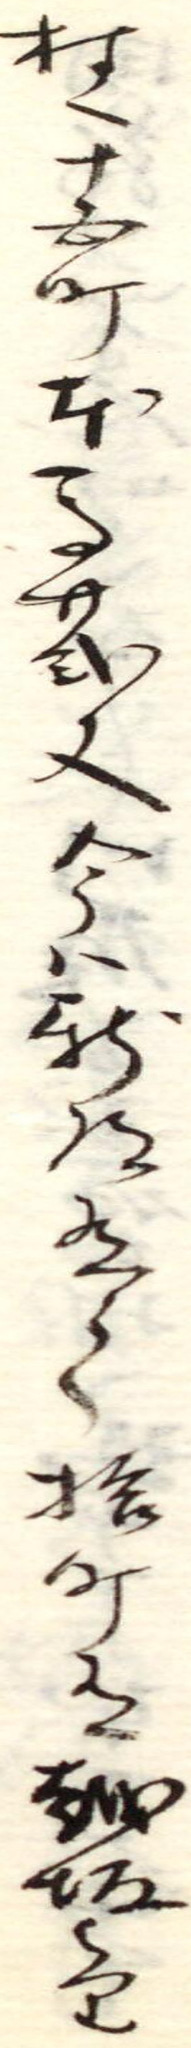村へ十五町本馬廿弐文今は新道有て拾町有越坂より
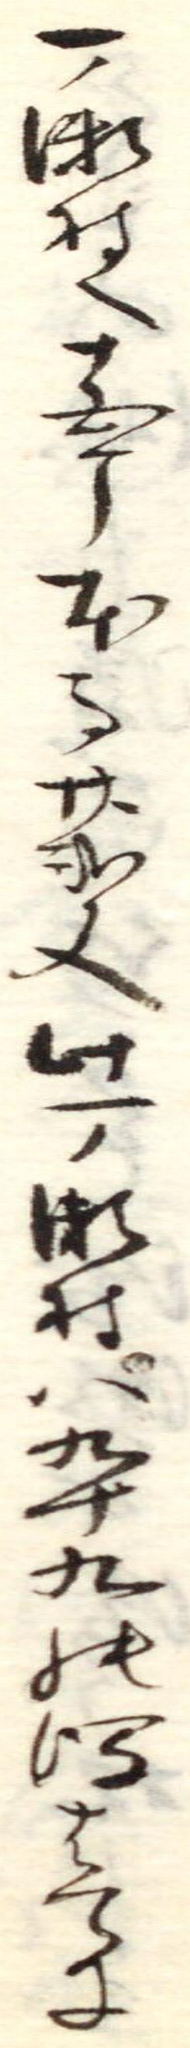一ノ瀬村へ十五丁本馬廿文此一ノ瀬村は九十九の湾はてに
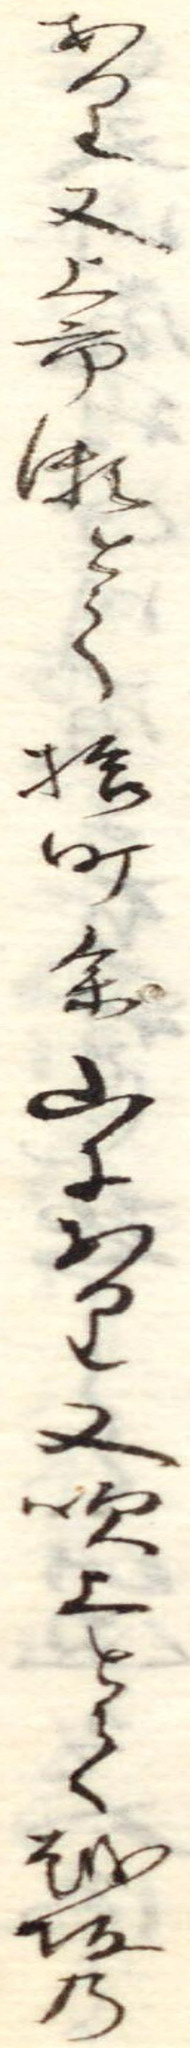あり又上市瀬とて拾町余山にあり又吹上とて越坂の
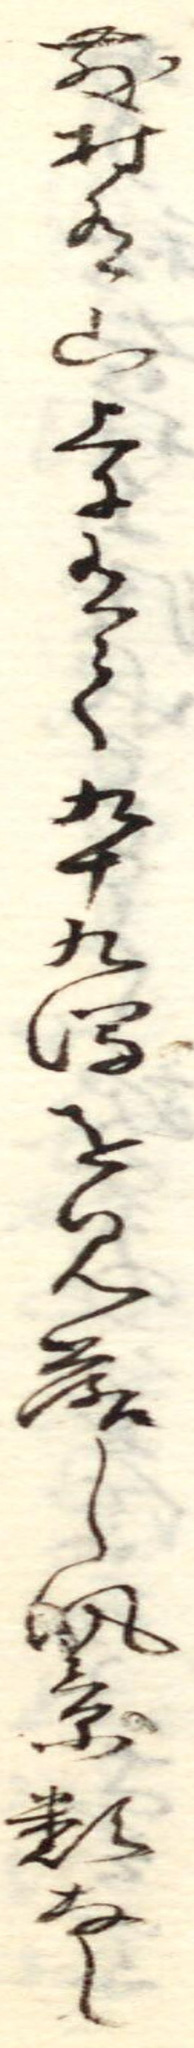散村有山上に有て九十九潟を見落し風景類なし
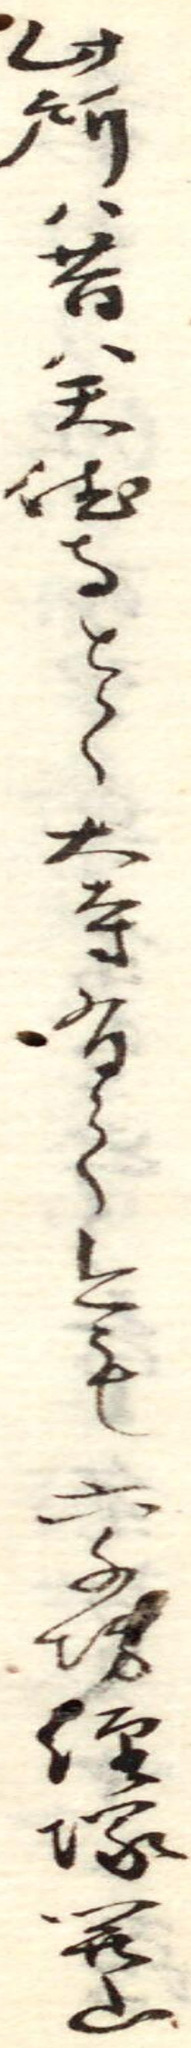此所は昔は天徳寺とて大寺有て今も六千坊経塚開山
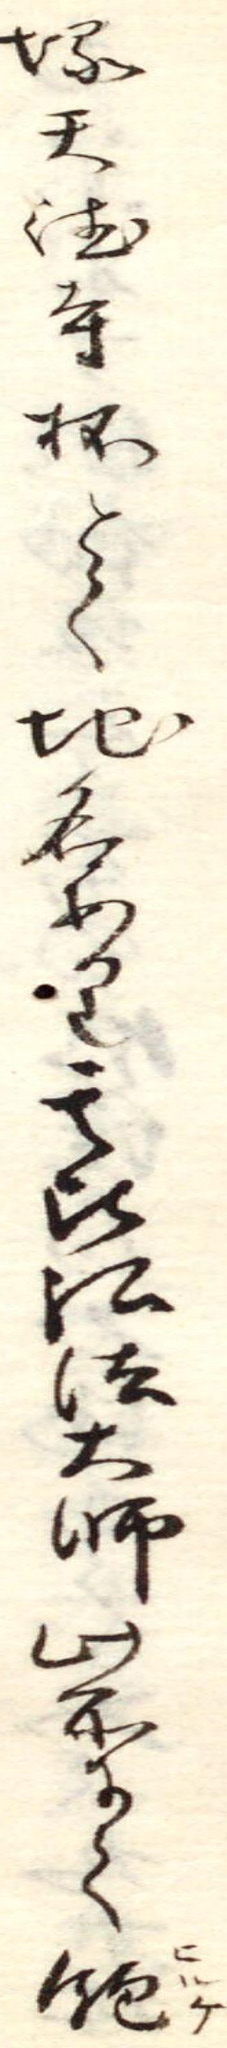塚天徳寺抔とて地名あり其頃弘法大師此所にて飽
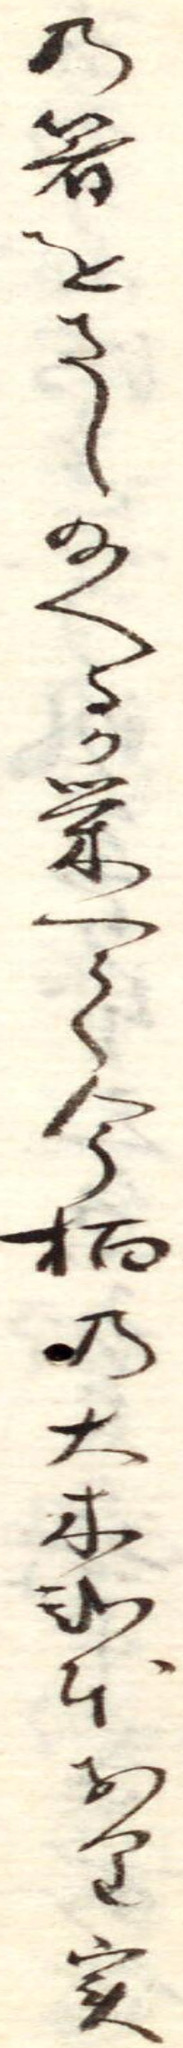の箸をさし給へるか栄へて今栢の大木弐本あり実
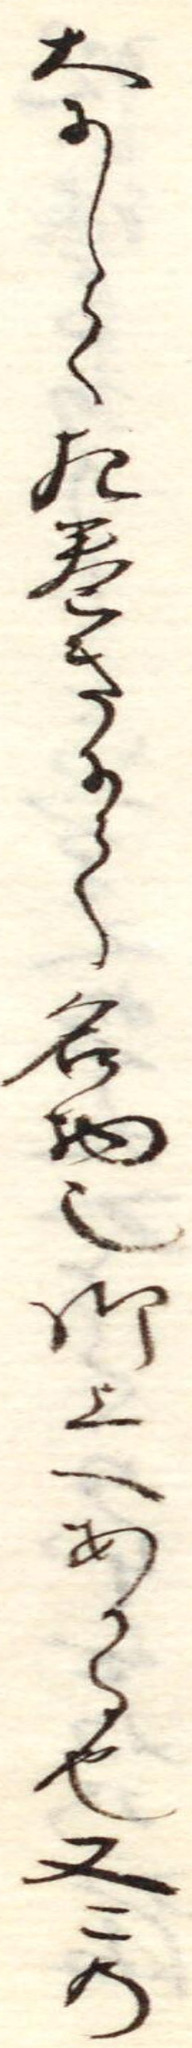大にして右巻きにて名物也御上へあかる也又この
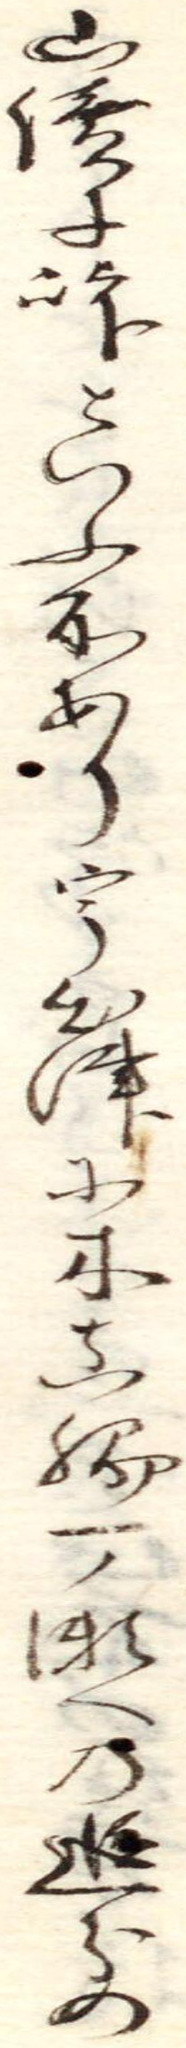山続に峠といふ所あり宇出津小木真脇一ノ瀬への追分の
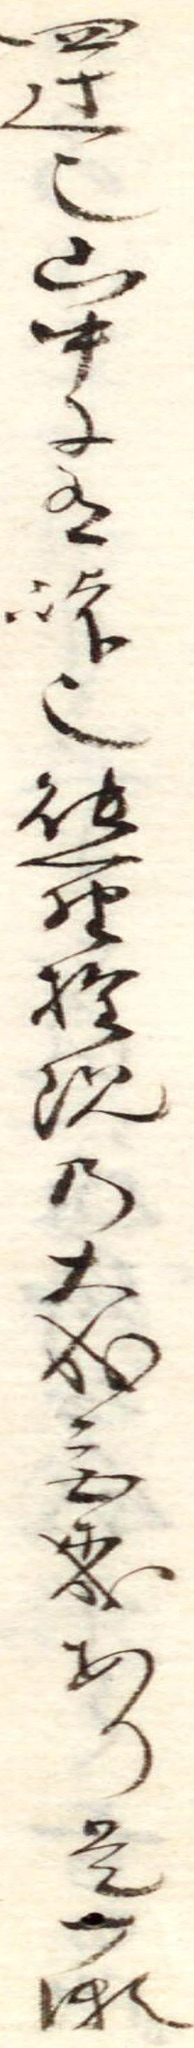四辻也山中に有峠也熊野権現の大成宮森あり是一ノ瀬
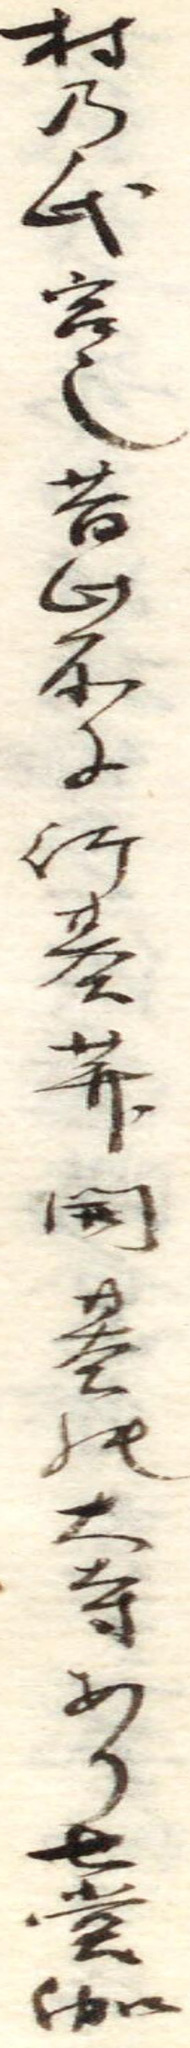村の氏宮也昔此所に行基菩薩開基の大寺あり七堂伽
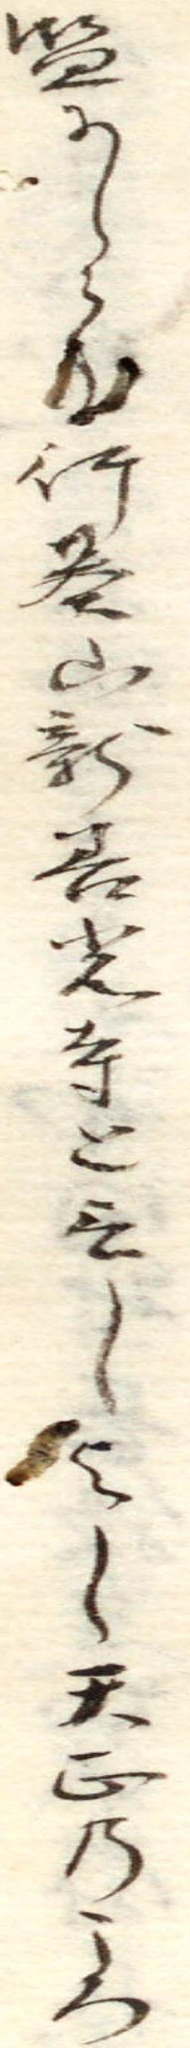藍にして行基山新善光寺と言しよし天正のころ
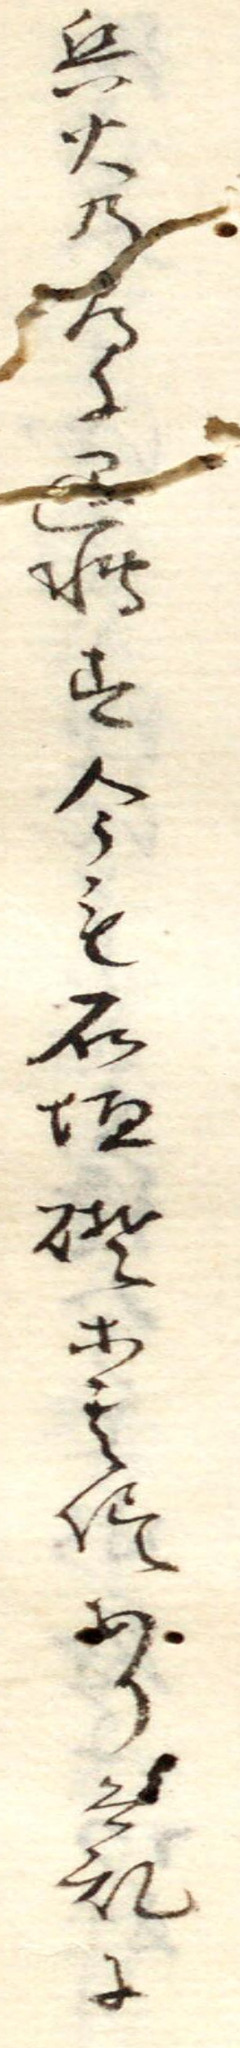兵火の為に退転す今も石垣礎等其侭あり兵乱に

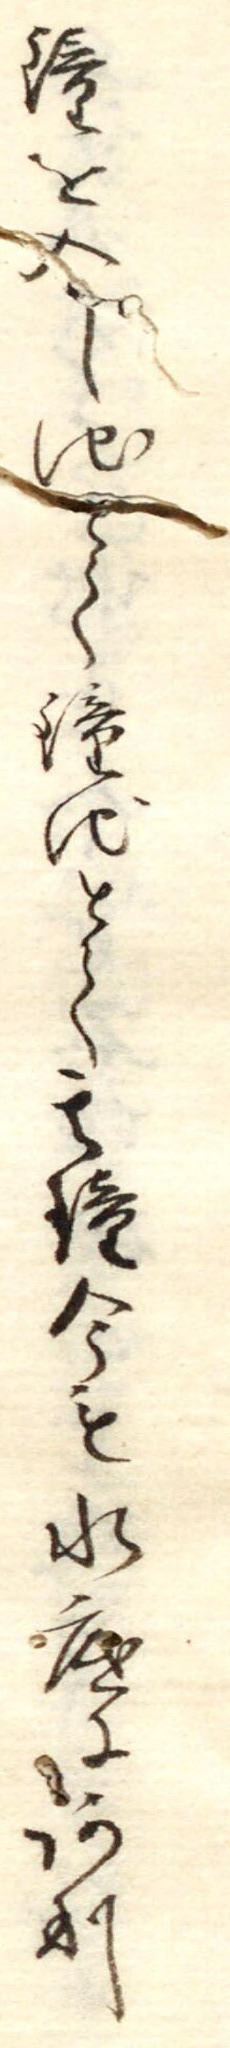鐘を入し池とて鐘池とて其鐘今も水底にあり
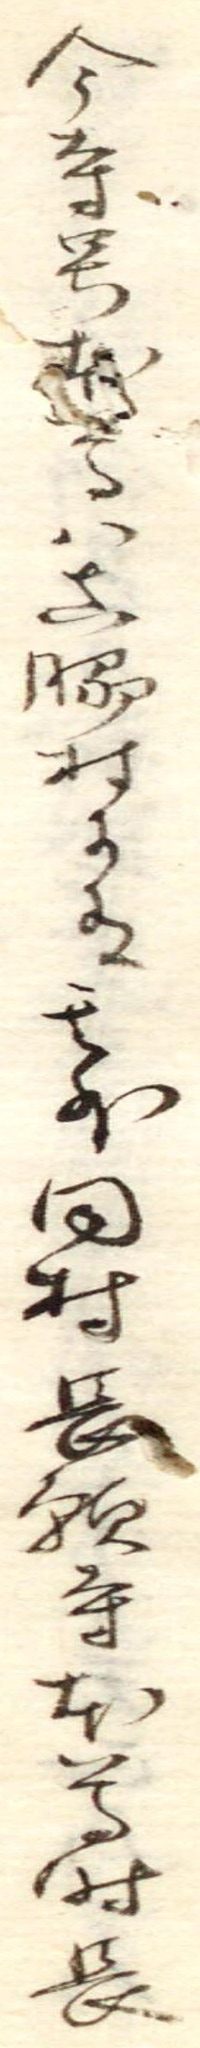今寺号本尊は真脇村に有其外同村長願寺本尊時長
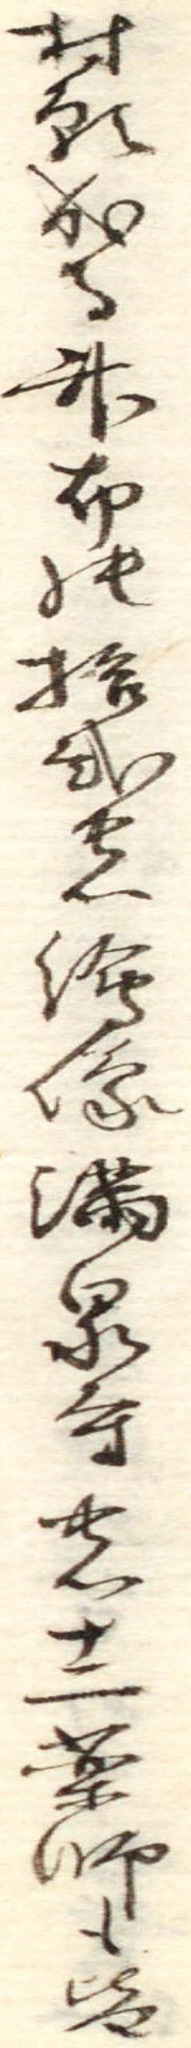村願成寺竹布の拾弐の絵像満泉痔寺の十二薬師も皆
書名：能登名跡誌
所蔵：Ishikawa Prefectural Library
